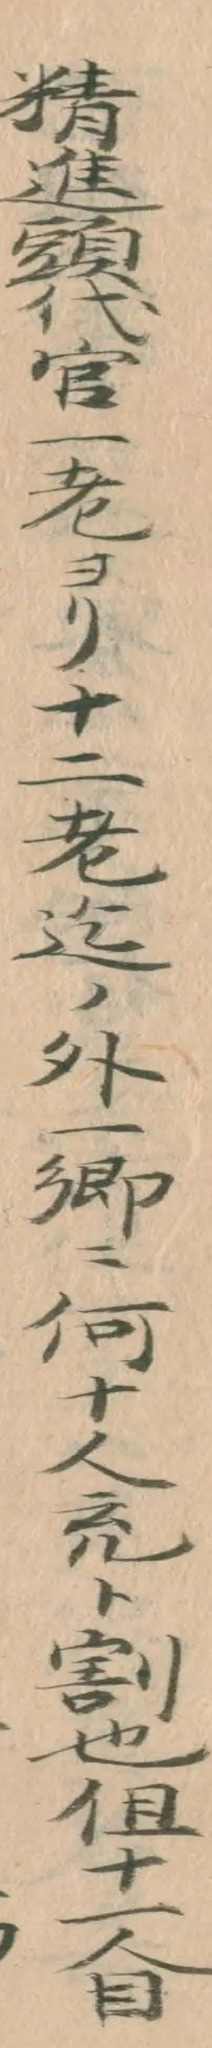一精進頭代官一老ヨリ十二老迄ノ外一郷ニ何十人充ト割也但十一人目
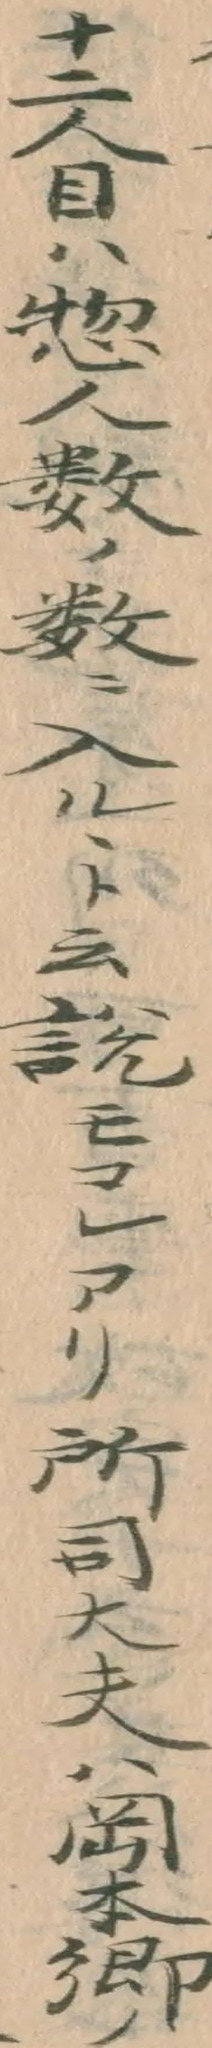十二人目ハ惣人数ノ数ニ入ルヽト云説モコレアリ所司大夫ハ岡本郷ノ
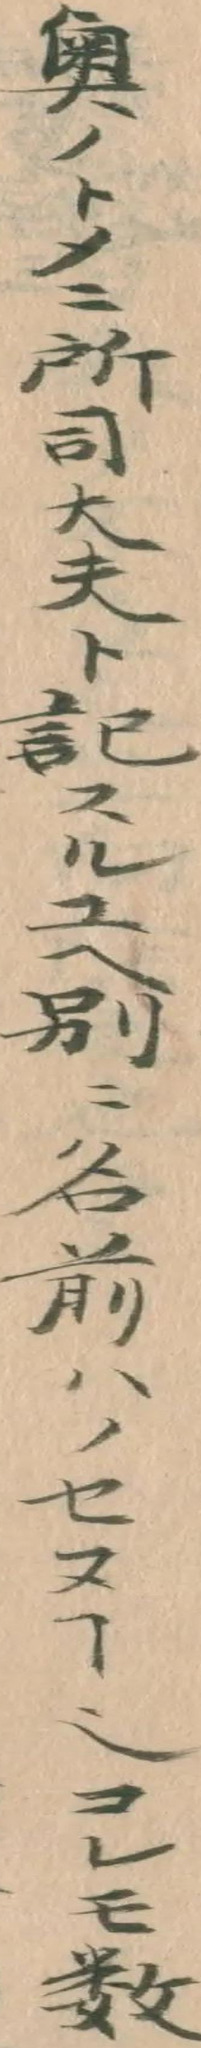奥ノト〆ニ所司大夫ト記スルユヘ別ニ名前ハノセヌヿ也コレモ数
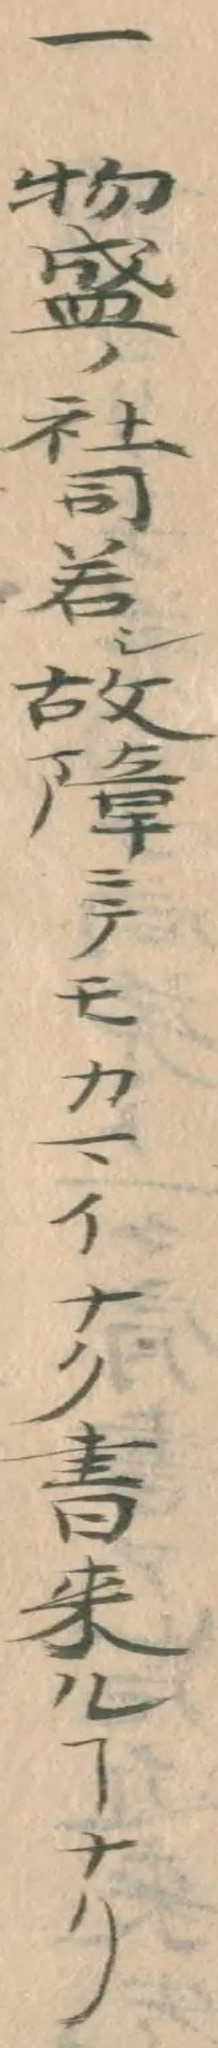一物盛ノ社司若シ故障ニテモカマイナク書来ルヿナリ
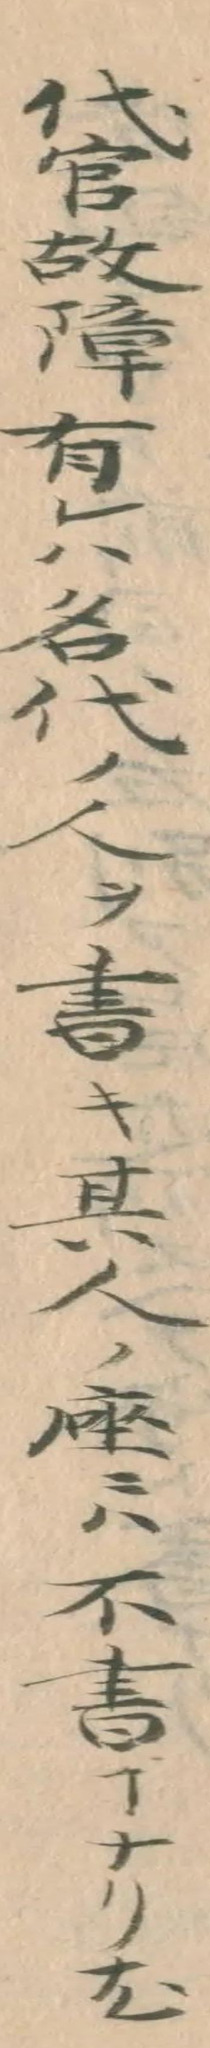一代官故障有レハ名代ノ人ヲ書キ其人ノ座ニハ不書ヿナリ尤
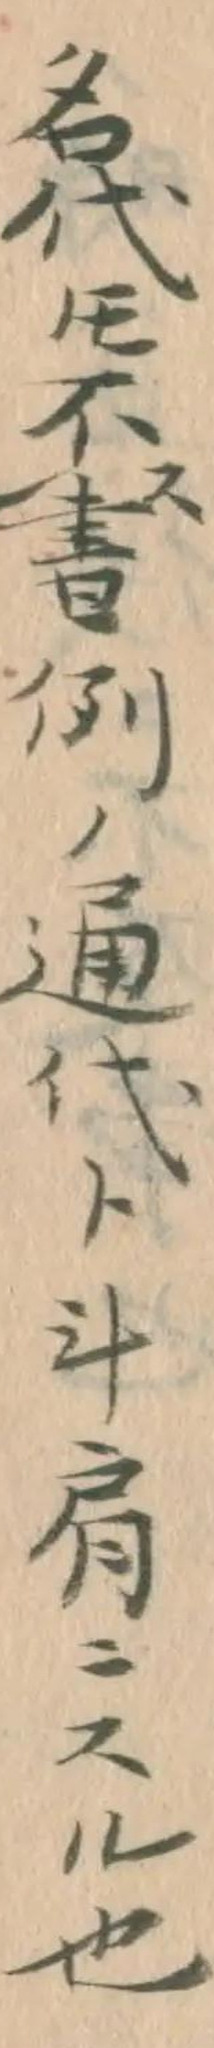名代トモ不書例ノ通代ト斗肩ニスル也
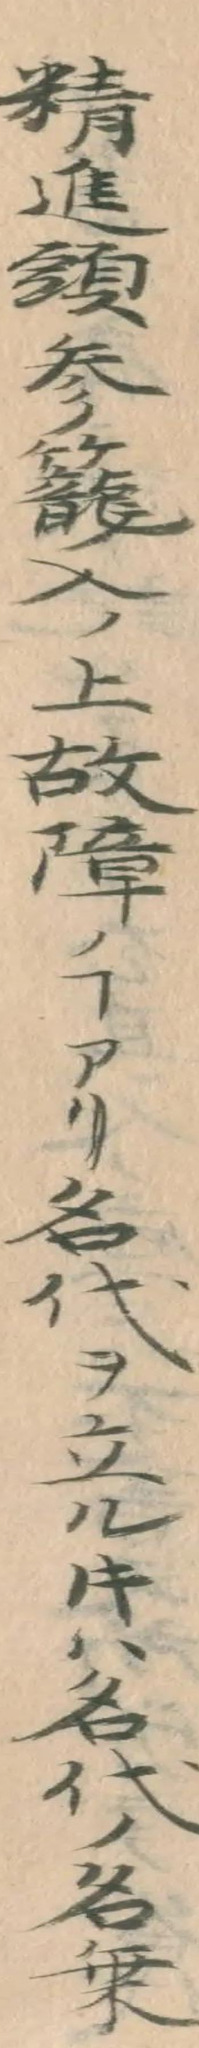一精進頭参籠入ノ上故障ノヿアリ名代ヲ立ルトキハ名代ノ名乗

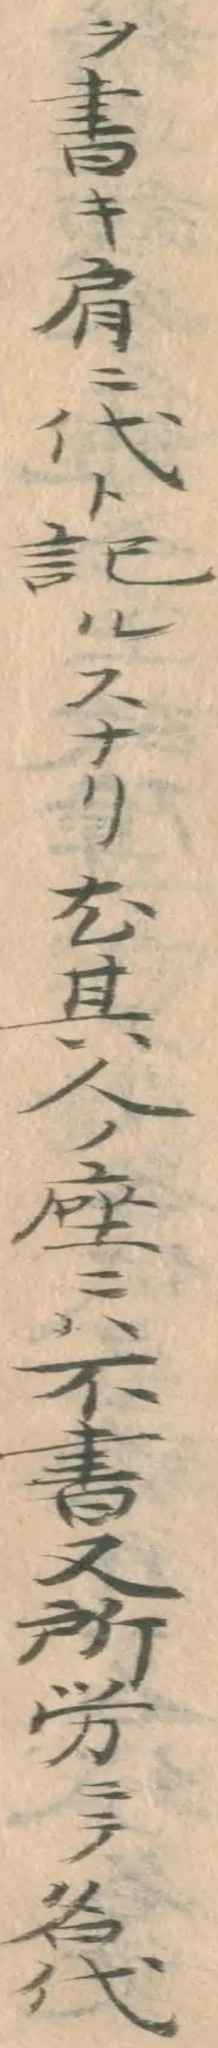ヲ書キ肩ニ代ト記ルスナリ尤其人ノ座ニハ不書又所労ニテ名代
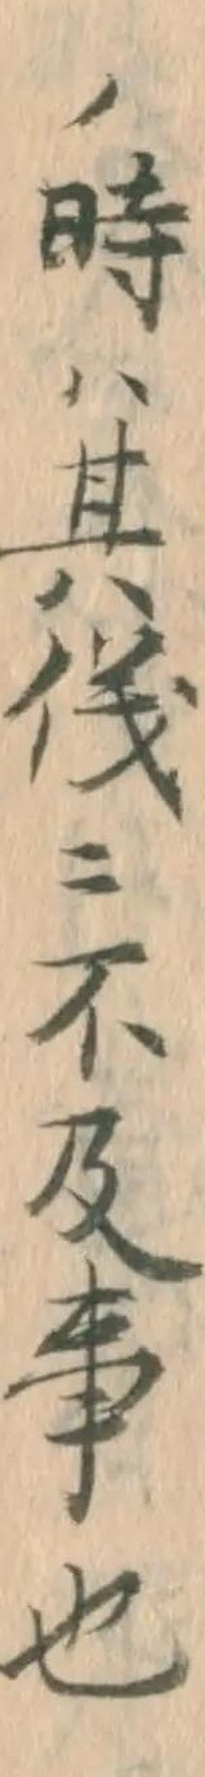ノ時ハ其儀ニ不及事也
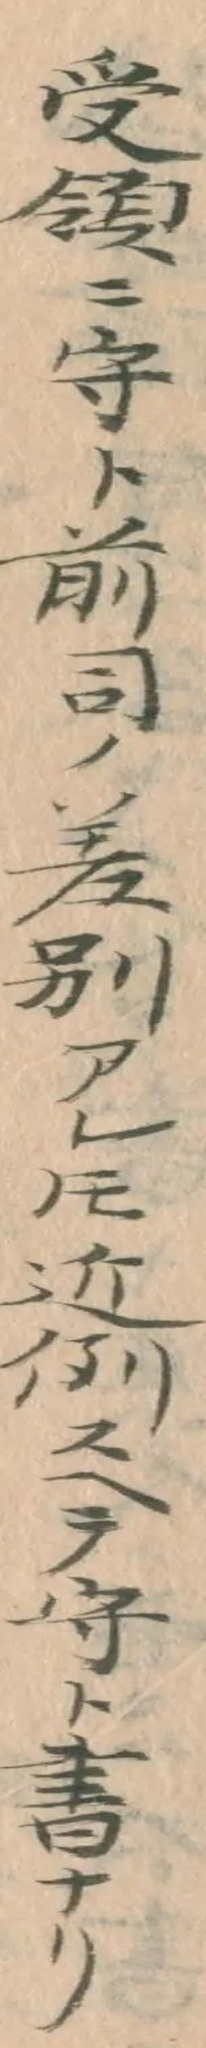一受領ニ守ト前司ノ差別アレトモ近例スヘテ守ト書ナリ
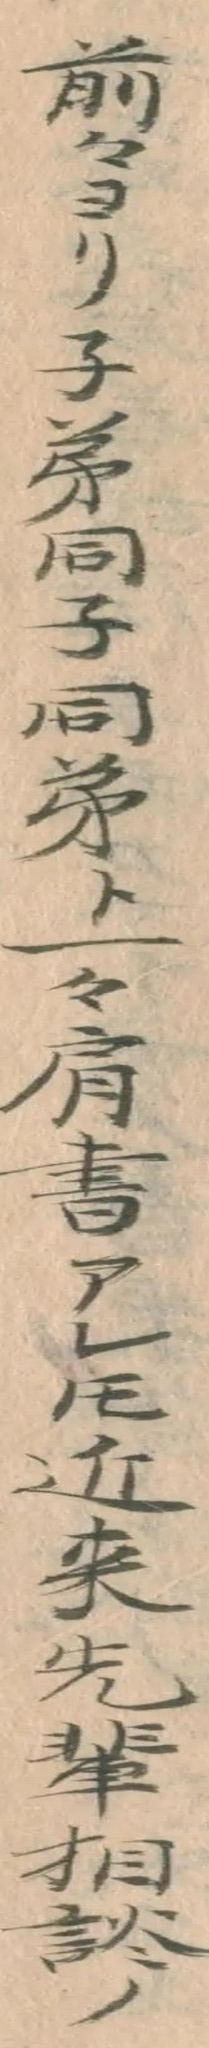一前々ヨリ子弟同子同弟ト一々肩書アレトモ近来先輩相談ノ
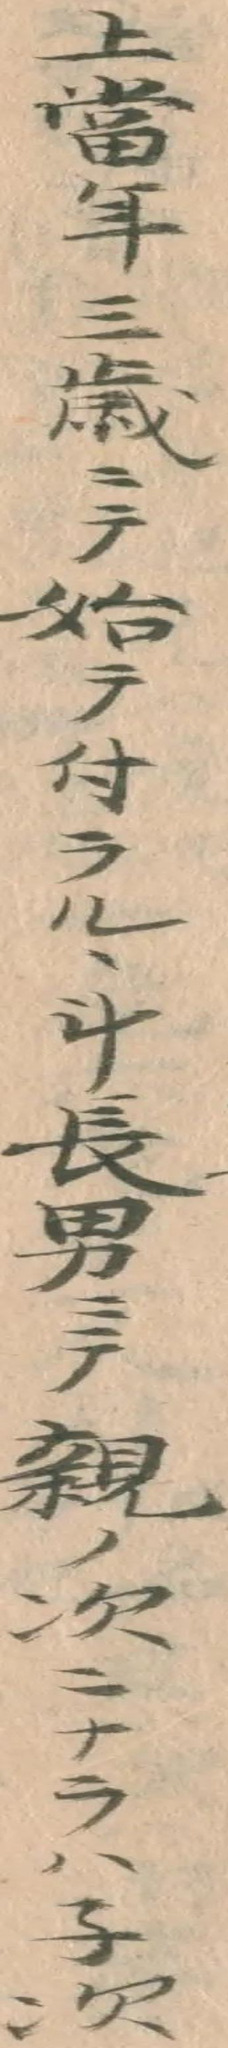上當年三歳ニテ始テ付ラルヽ斗長男ニテ親ノ次ニナラハ子次
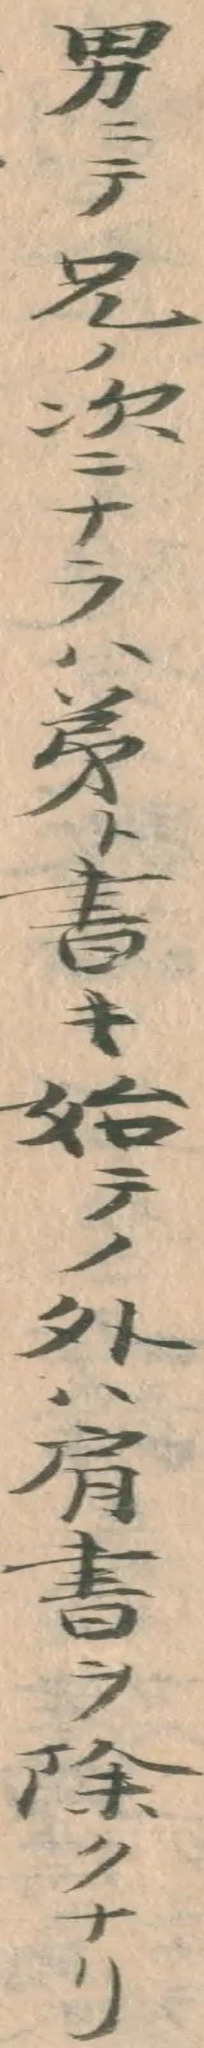男ニテ兄ノ次ニナラハ弟ト書キ始テノ外ハ肩書ヲ除クナリ
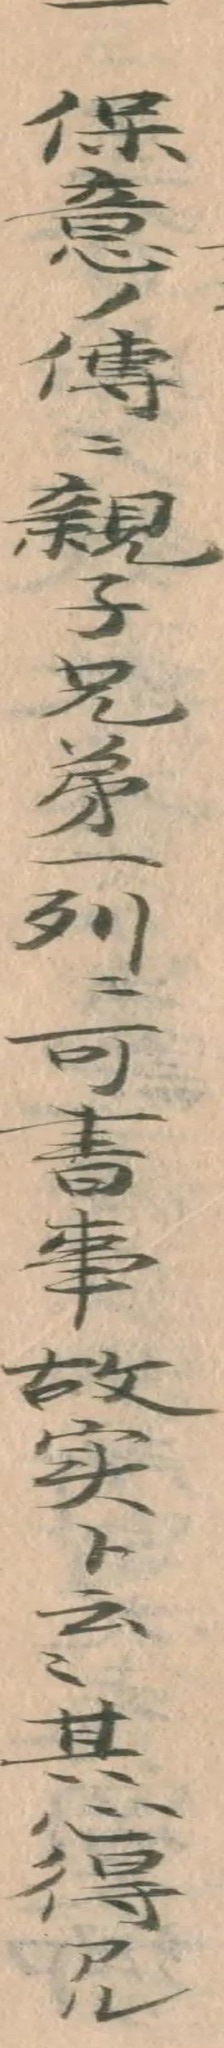一保意ノ傳ニ親子兄弟一列ニ可書事故実ト云々其心得アル
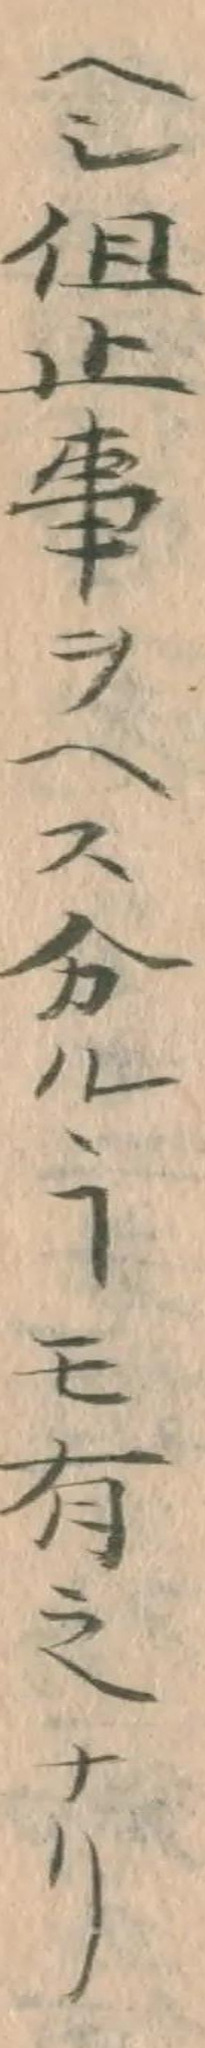ヘシ但止事ヲヘス分ルヽヿモ有之ナリ
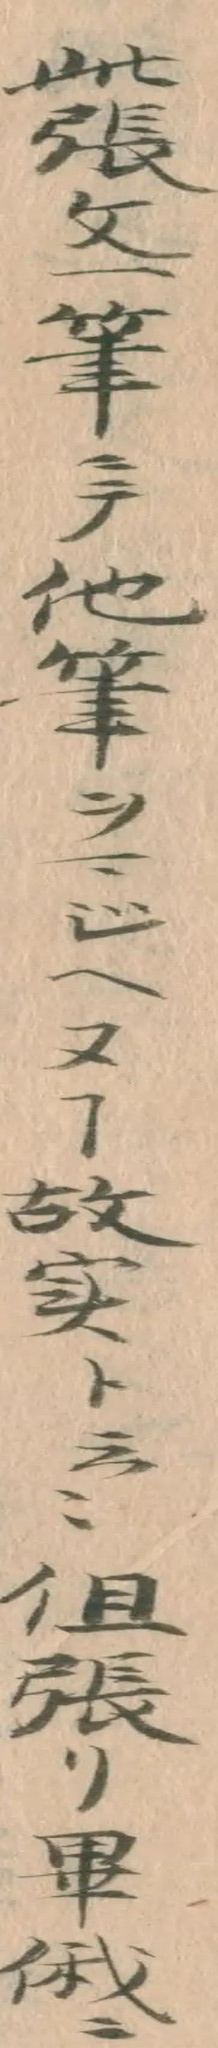一此張文一筆ニテ他筆ヲマジヘヌヿ故実ト云〻但張リ畢我ニ
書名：賀茂社記録. 第40冊
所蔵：国立国会図書館 National Diet Library, JAPAN
